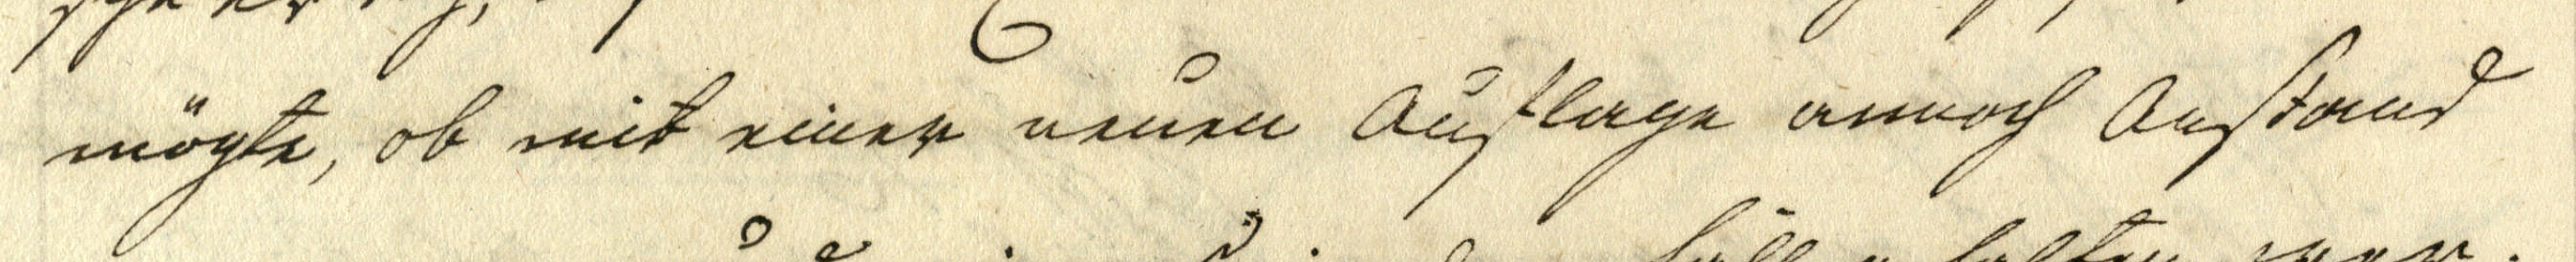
mögte, ob mit einer neuen Auflage annoch Anstand
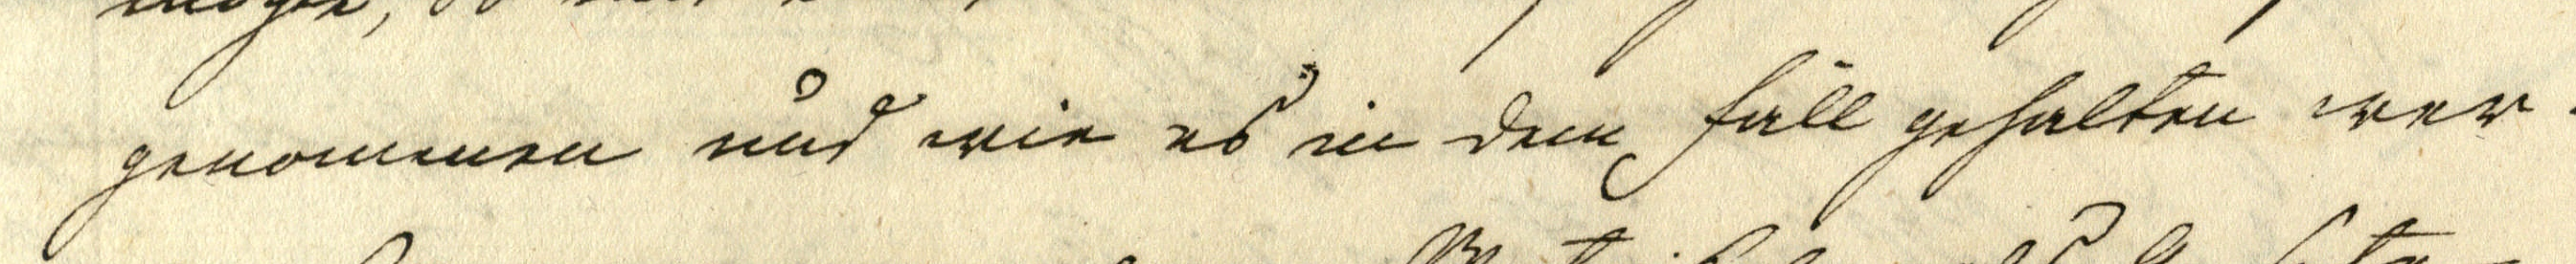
genommen und wie es in dem Fall gehalten wer-
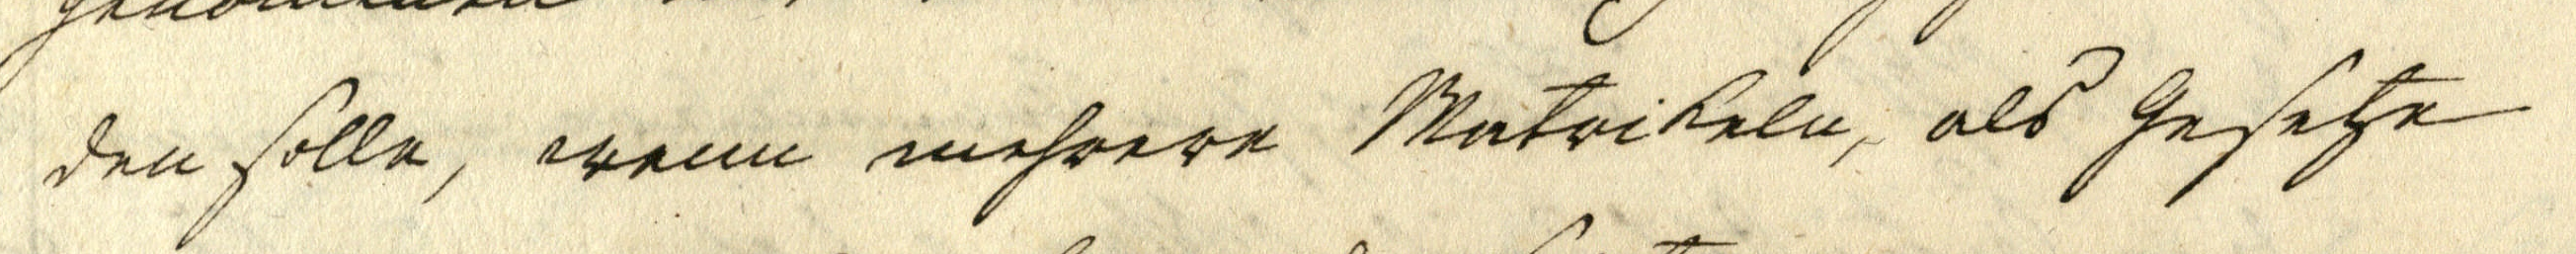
den solle, wenn mehrere Matrikeln, als Gesetze
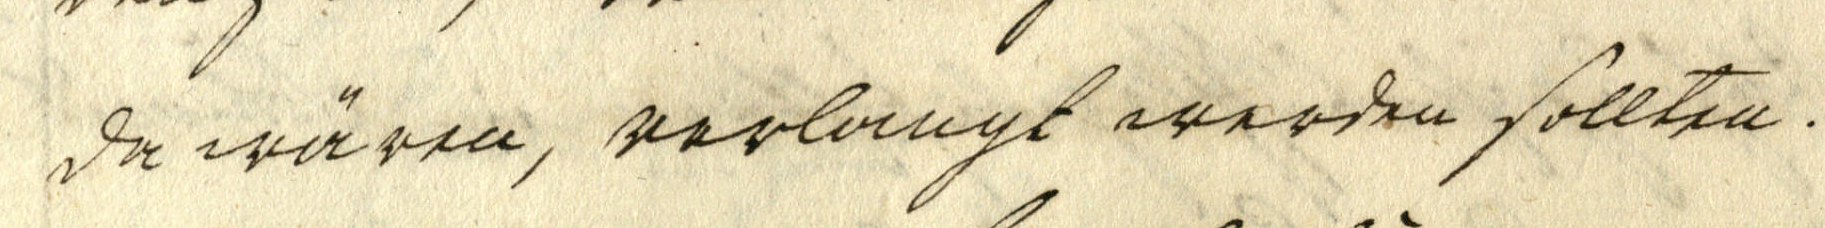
da wären, verlangt werden sollten.
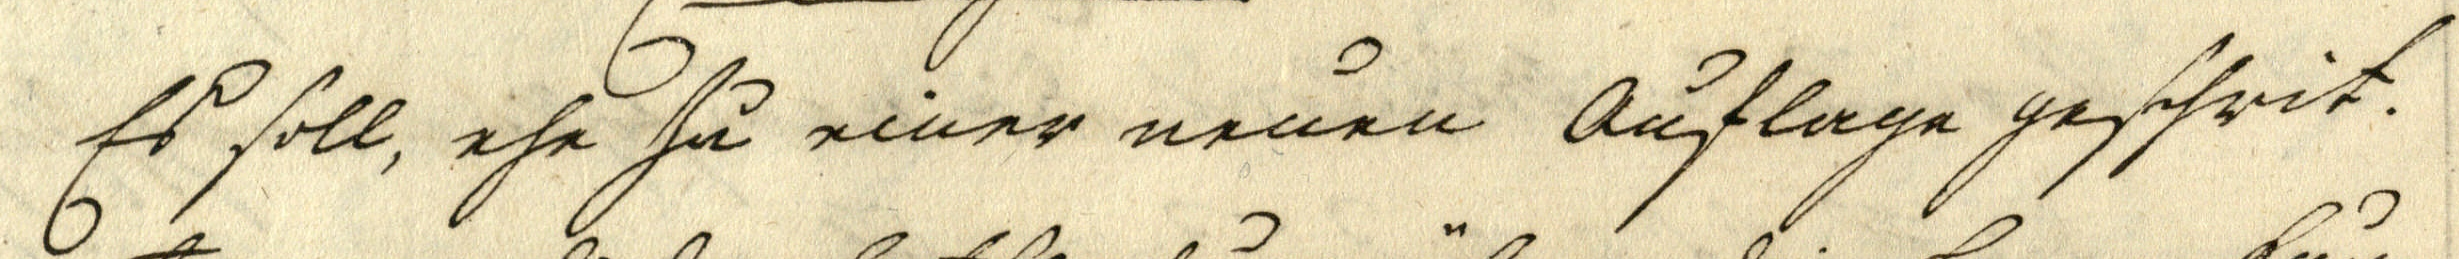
Es soll, ehe zu einer neuen Auflage geschrit-
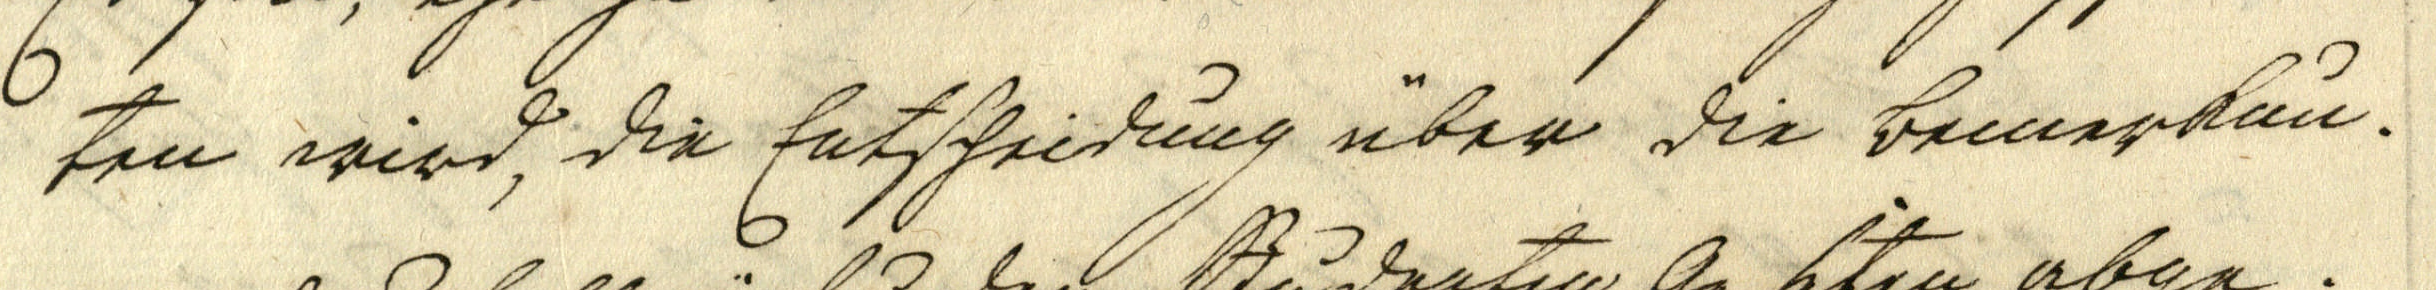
ten wird, die Entscheidung über die Bemerkun-
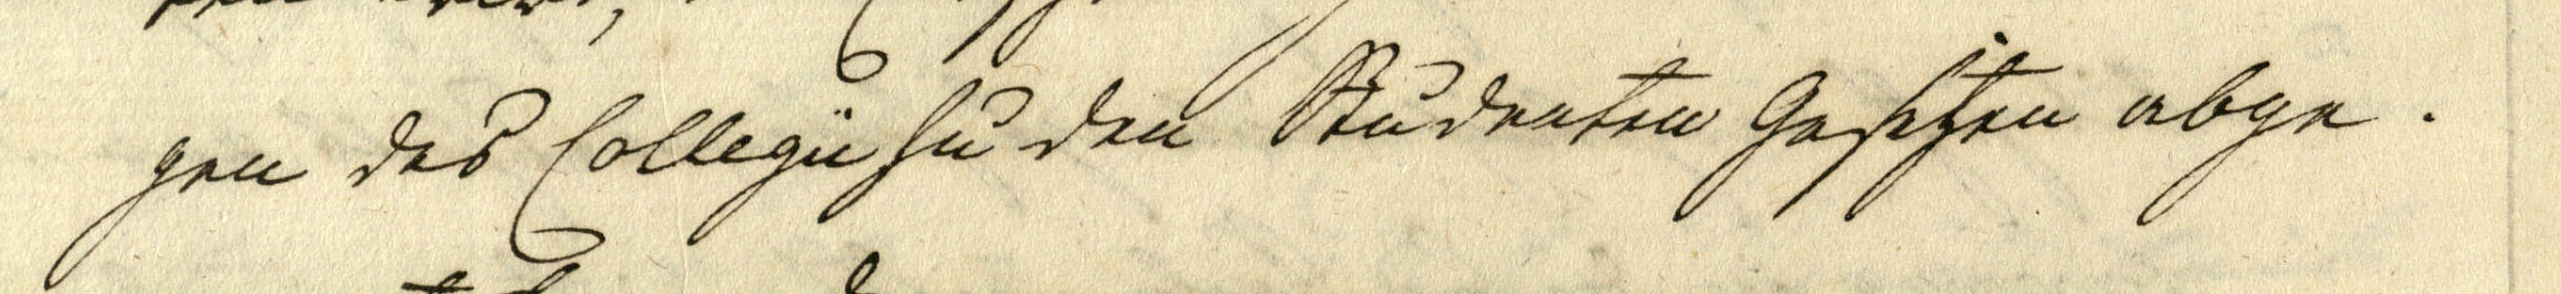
gen des Collegii zu den Studenten Gesetzen abge-
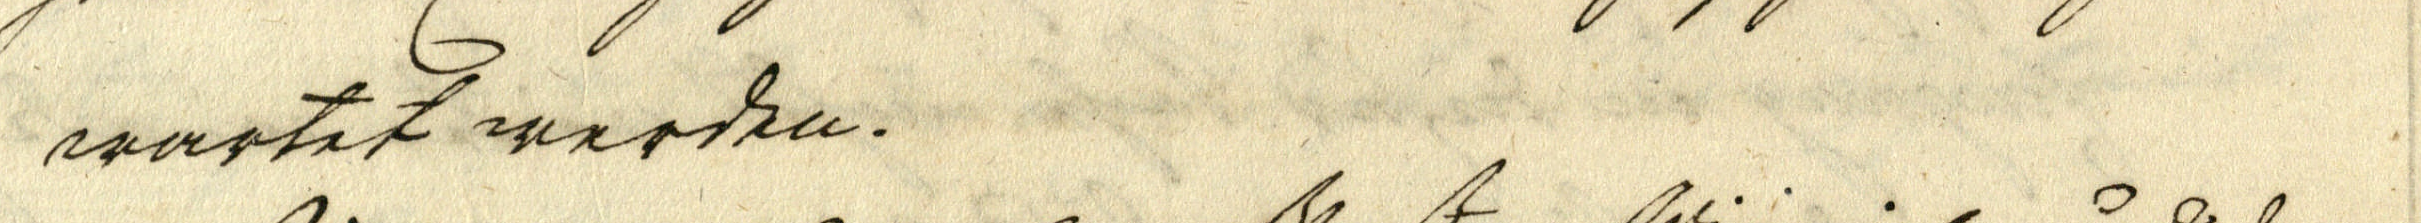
wartet werden.
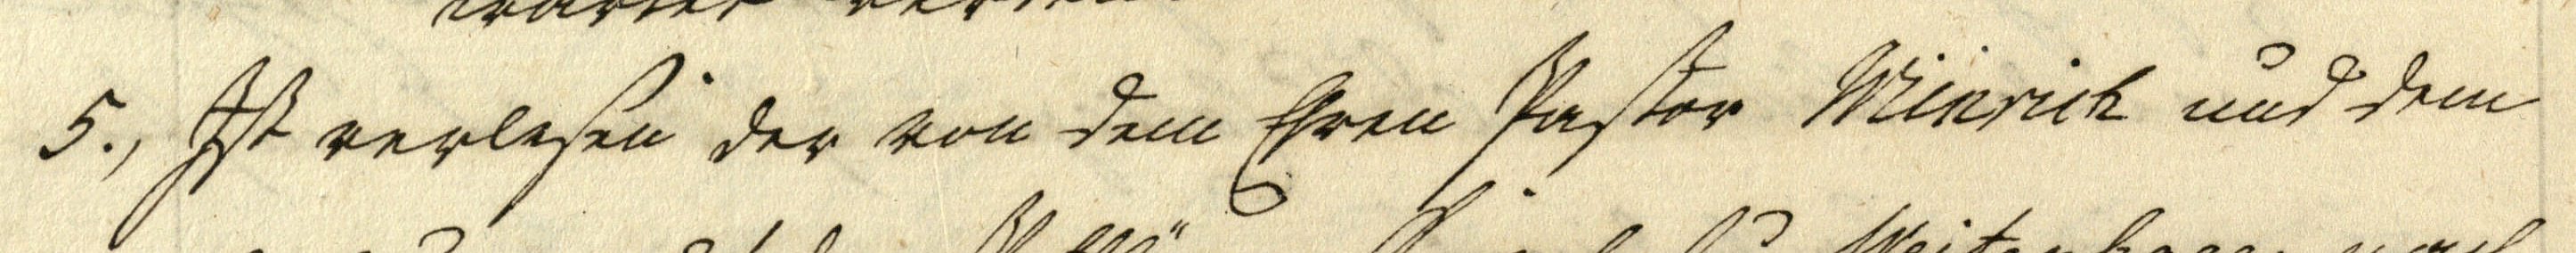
5. Ist verlesen der von dem Ehren Pastor Winrich und dem
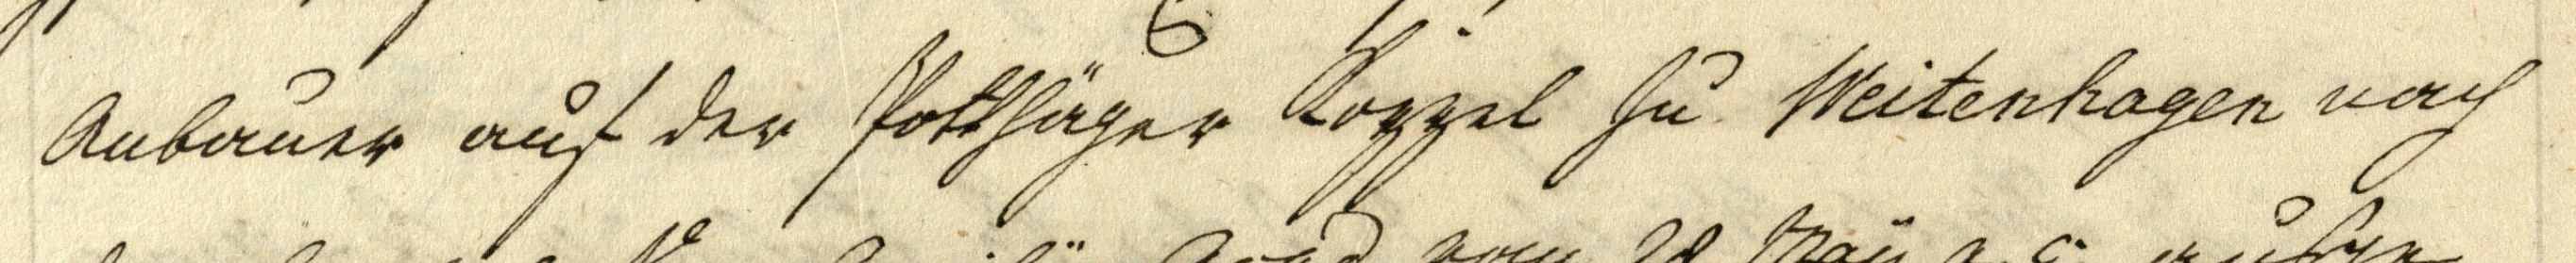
Anbauer auf der Potthäger Koppel zu Weitenhagen nach
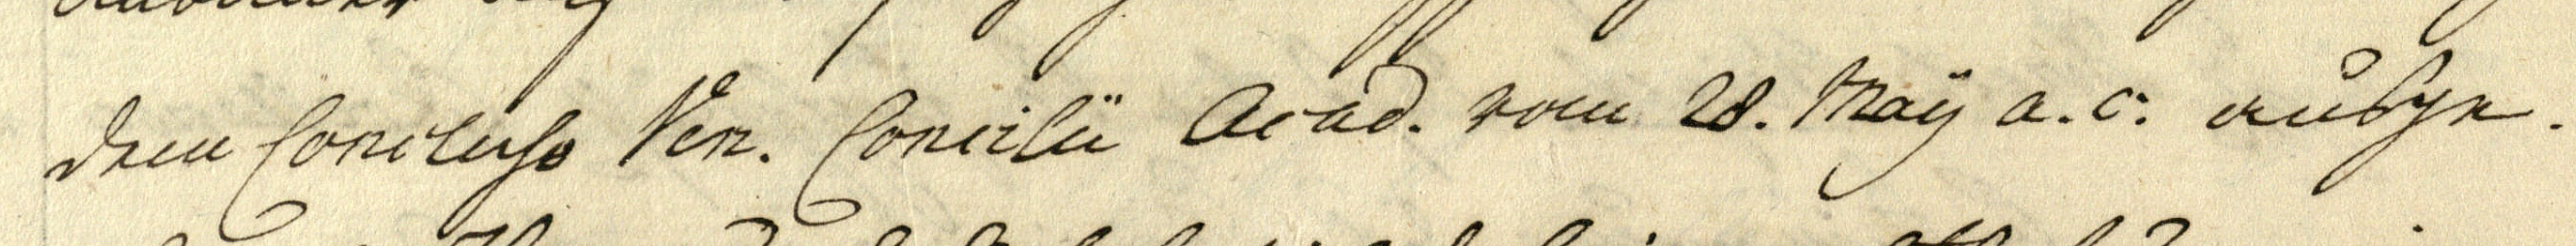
dem Concluso Ven. Concilii Acad. vom 28. May a. c. ausge-
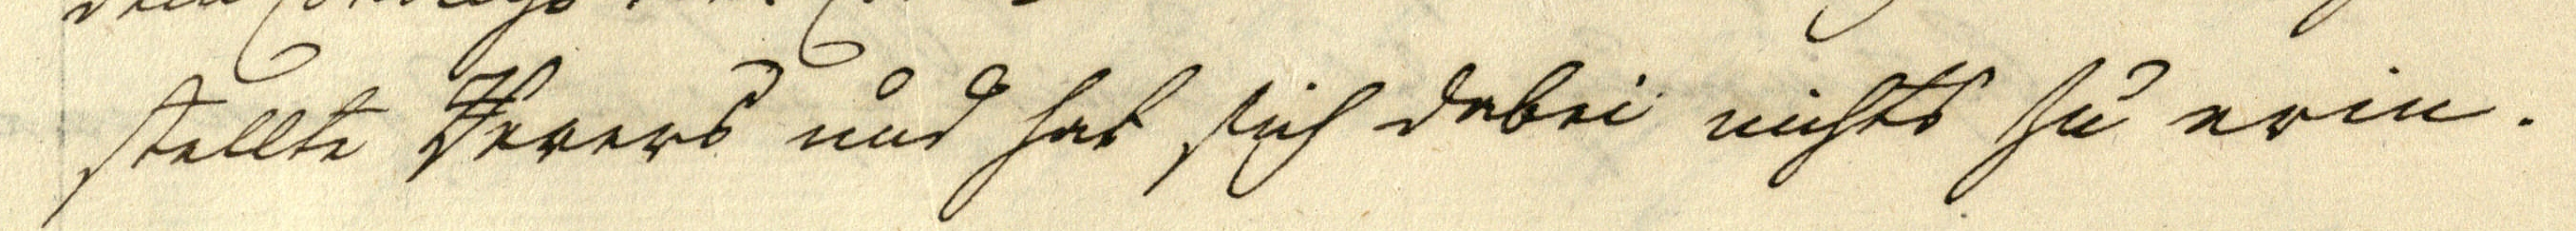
stellte Revers und hat sich dabei nichts zu erin-
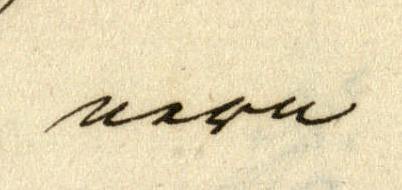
nern
